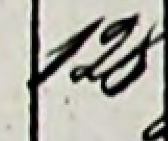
128
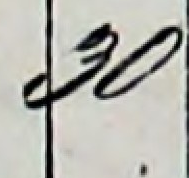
30
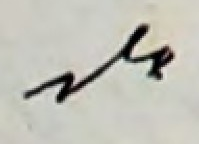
do
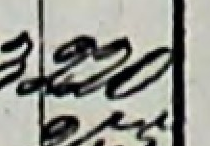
220
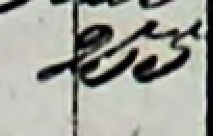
255
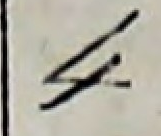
4
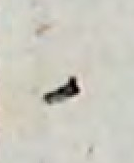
„
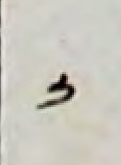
„
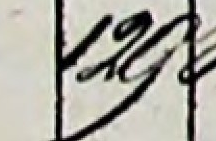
129
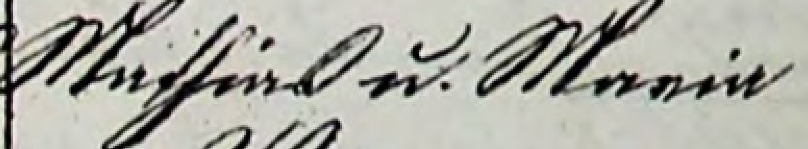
Mathias u. Maria
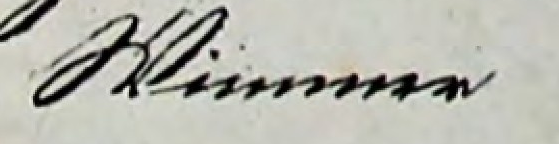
Wimmer
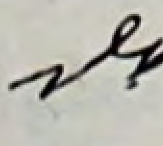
do
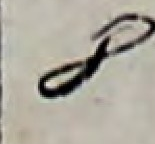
8
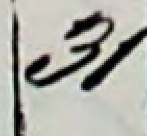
31
